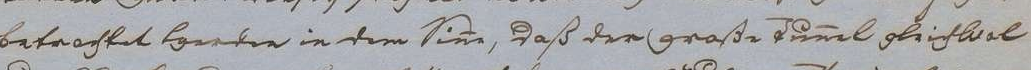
betrachtet werden in dem Sinne, daß der große Tunnel gleichwol
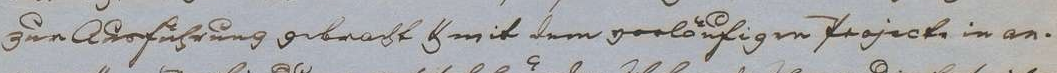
zur Ausführung gebracht & mit dem vorläufigen Project in an-
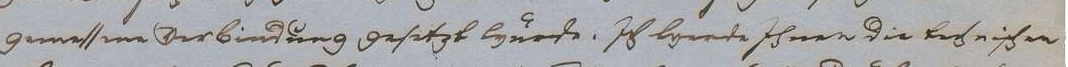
gemessene Verbindung gesetzt würde. Ich werde Ihnen die technischen
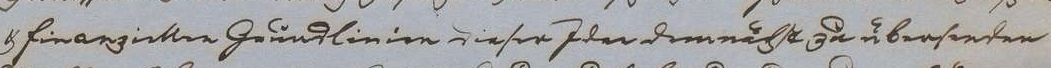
& finanziellen Grundlinien dieser Idee demnächst zu übersenden
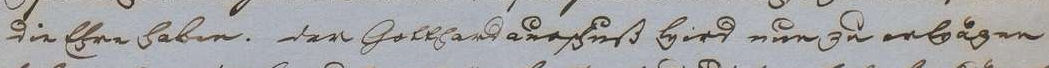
die Ehre haben. Der Gotthardausschuß wird nun zu erwägen
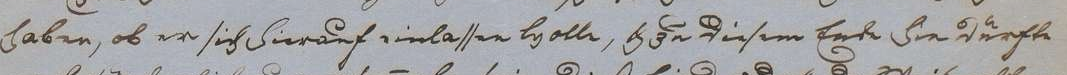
haben, ob er sich hierauf einlassen wolle, & zu diesem Ende hin dürfte
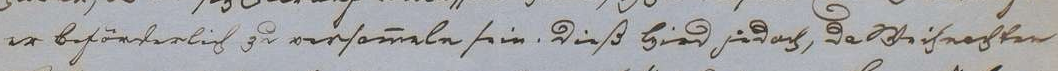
es beförderlich zu versammeln sein. Dieß wird jedoch, da Weihnachten
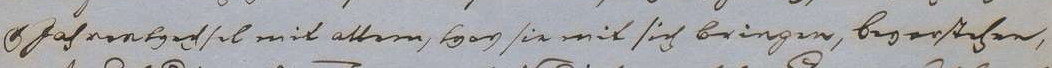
& Jahreswechsel mit allem, was sie mit sich bringen, bevorstehen,
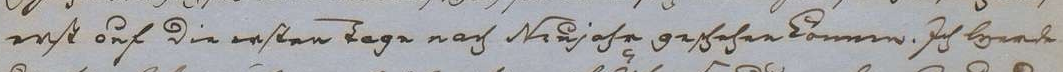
erst auf die ersten Tage nach Neujahr geschehen können. Ich werde
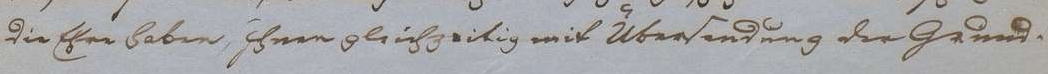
die Ehre haben, Ihnen gleichzeitig mit Übersendung der Grund-
